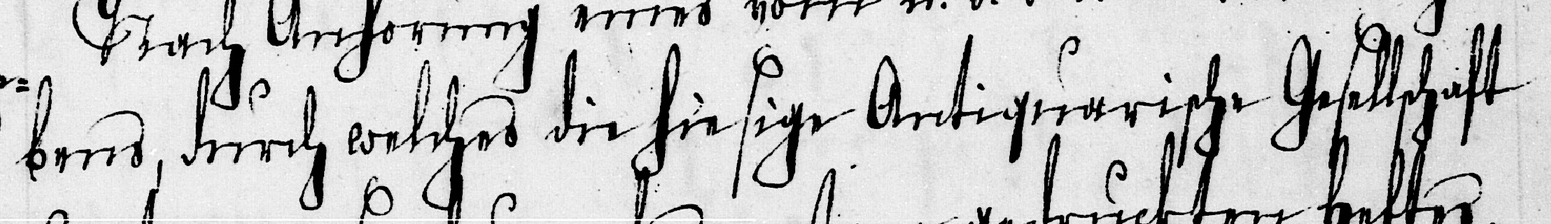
bens, durch welches die hiesige Antiquarische Gesellschaft
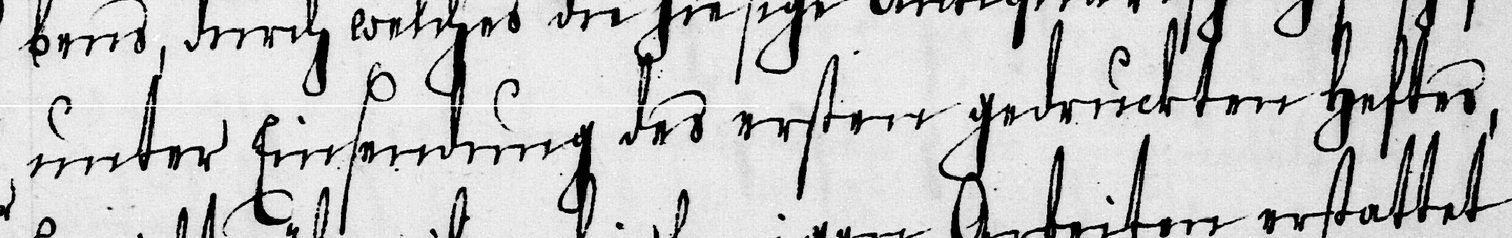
unter Einsendung des ersten gedruckten Heftes,
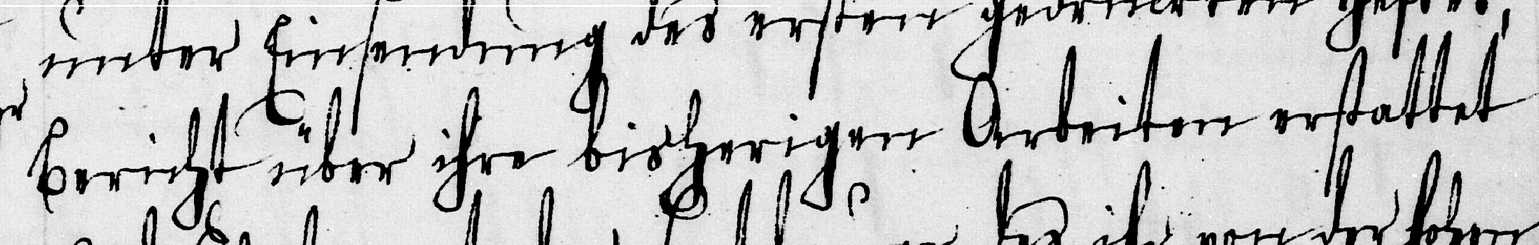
Bericht über ihre bisherigen Arbeiten erstattet
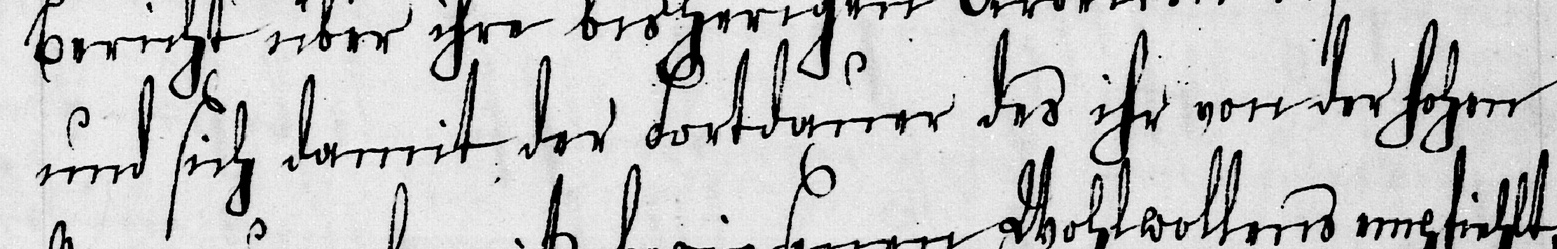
und sich damit der Fortdauer des ihr von der hohen
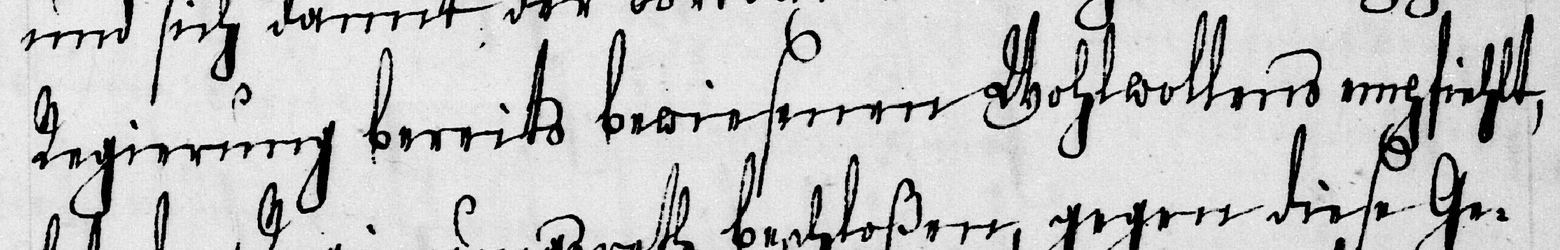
Regierung bereits bewiesenen Wohlwollens empfiehl¬
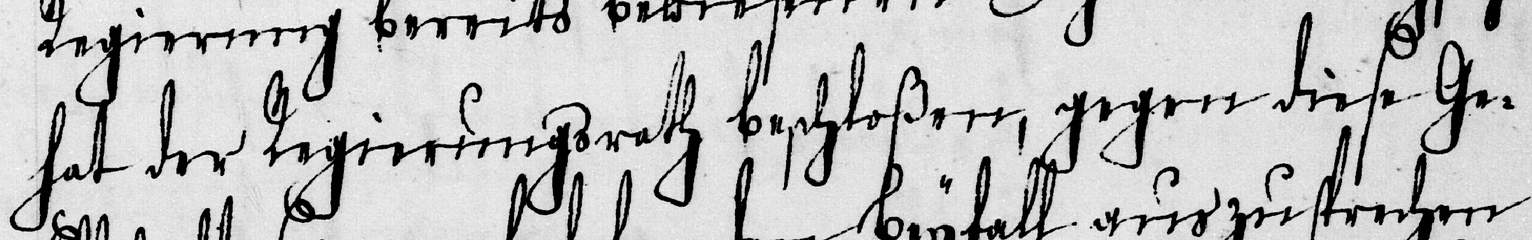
hat der Regierungsrath beschloßen, gegen diese Ge¬
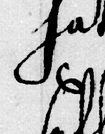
sel¬
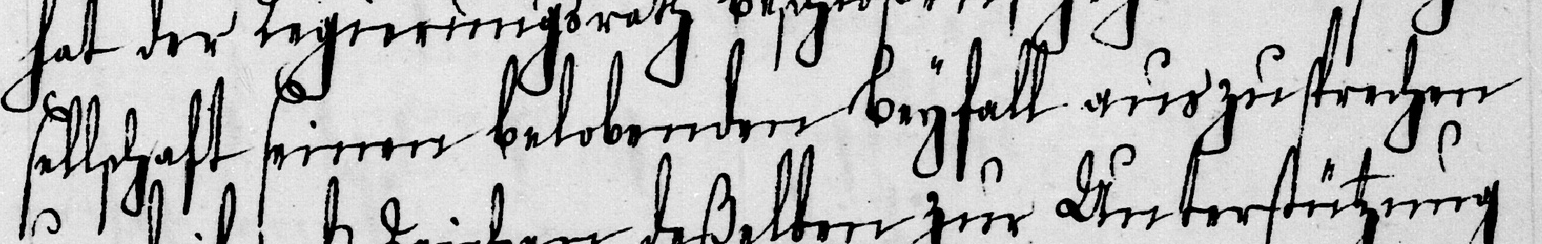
lschaft seinen belobenden Beyfall auszusprechen
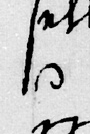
½.
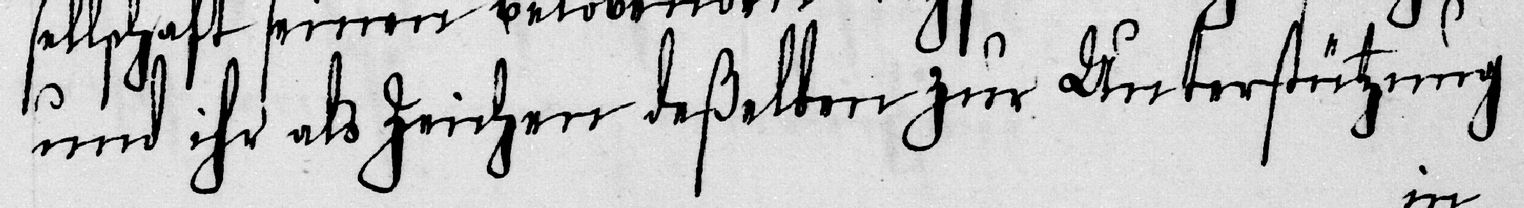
und ihr als Zeichen deßelben zur Unterstützung
